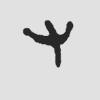又
